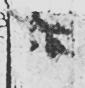六
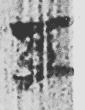五
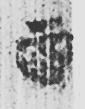百
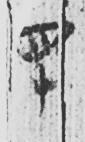{四十}
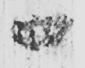四
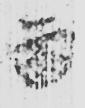百
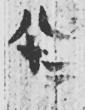八十=
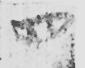四
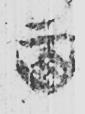百
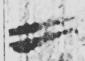二
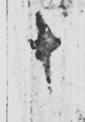十
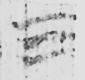三
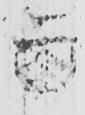百
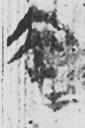六十=
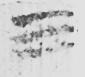三
